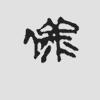備
